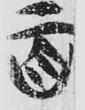百
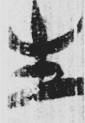生（姓）
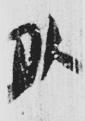外
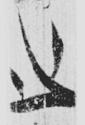之
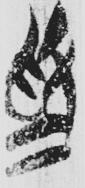爲
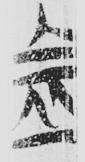者（諸）
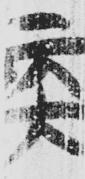侯（侯）
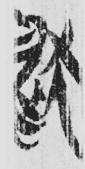○（嘲）
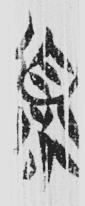寡
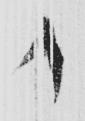人
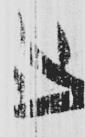之
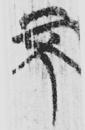不
